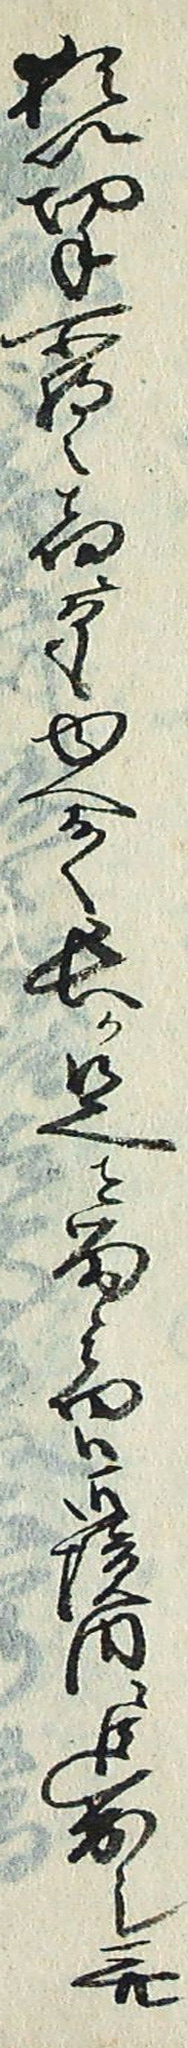猶以切手所持之者ニ而もゆへなく長ク足を留候者ハ御境目ニ追出シ幷
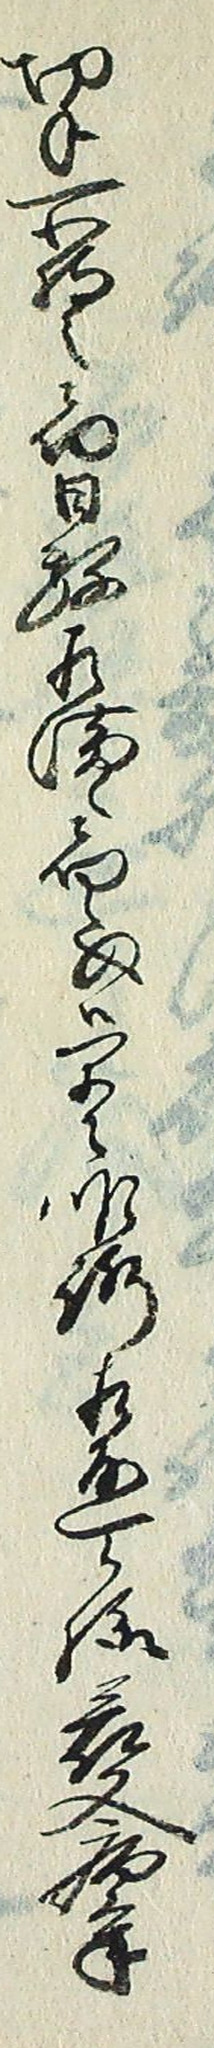切手所持之者日数相満候者之義ハ早々順路相通候様若又病気
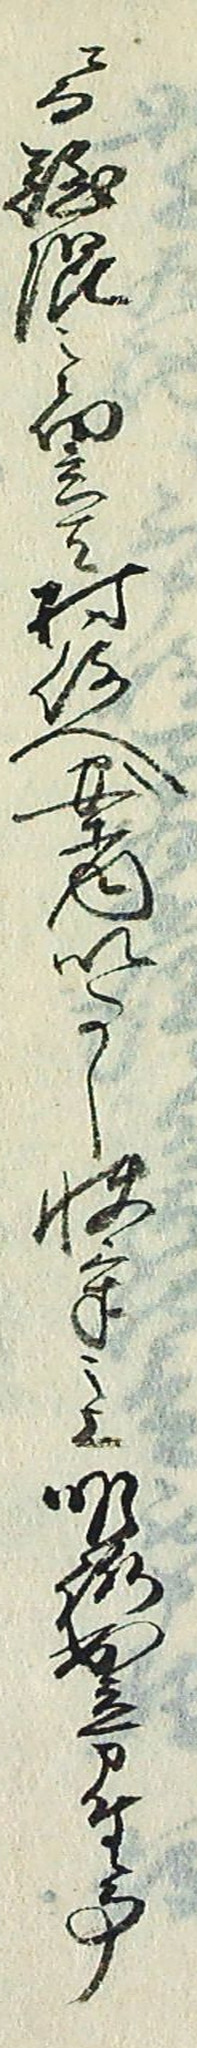ニ而難渋之者共者村役人へ案内いたし快気之上順路出立申付候事
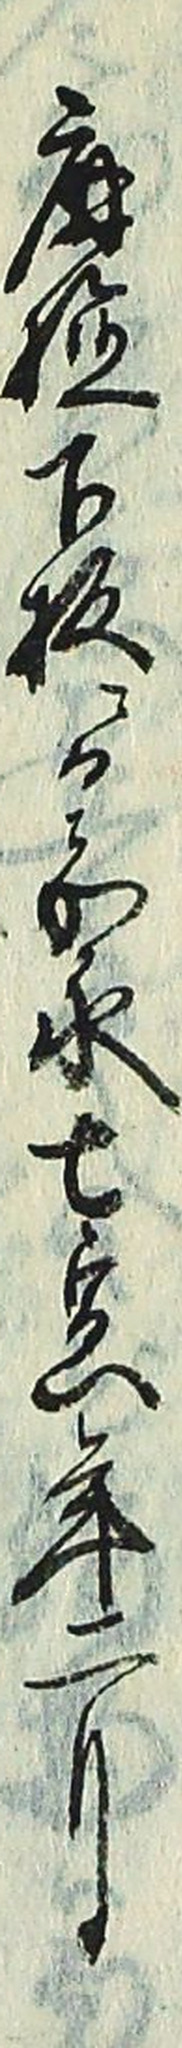麻植下坂ニ而嘉永七寅年二月
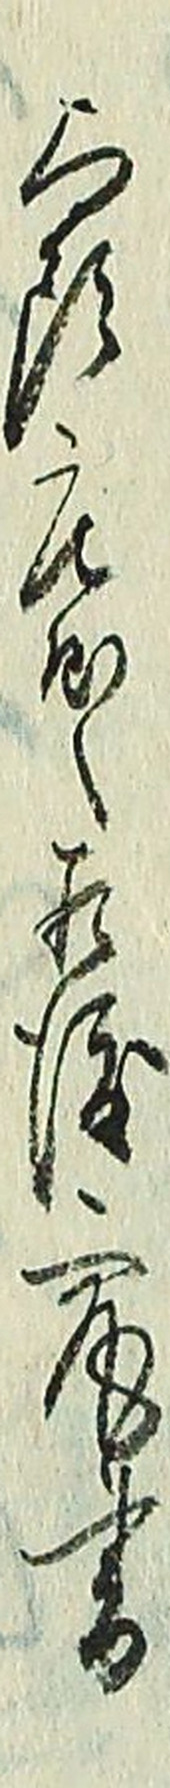与頭庄屋へ相渡究書
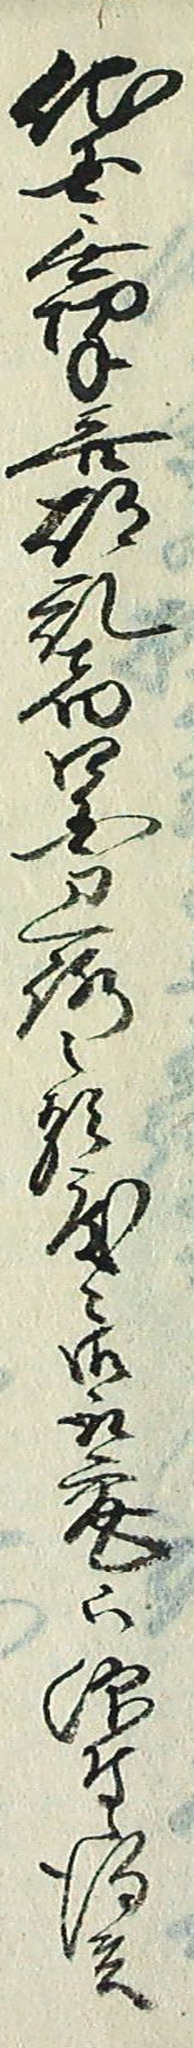他国無切手幷胡乱者四国辺路之類度々御取究被仰付候得共
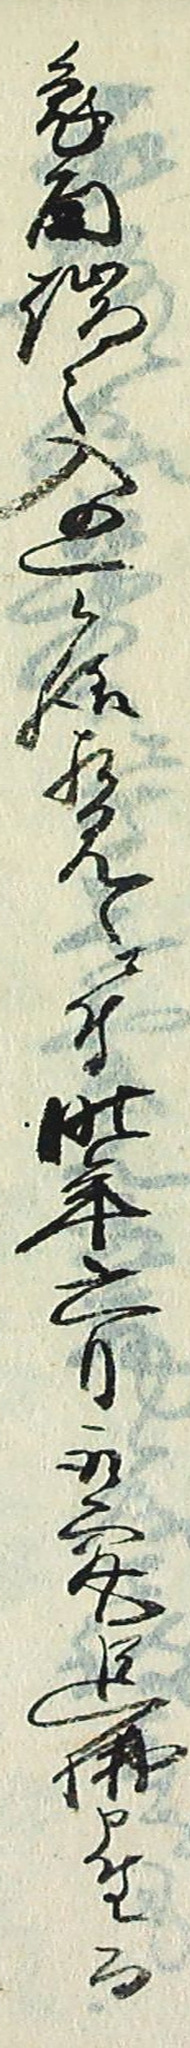兎角端々入込候様相見候ニ付昨年六月取究追拂申付候而
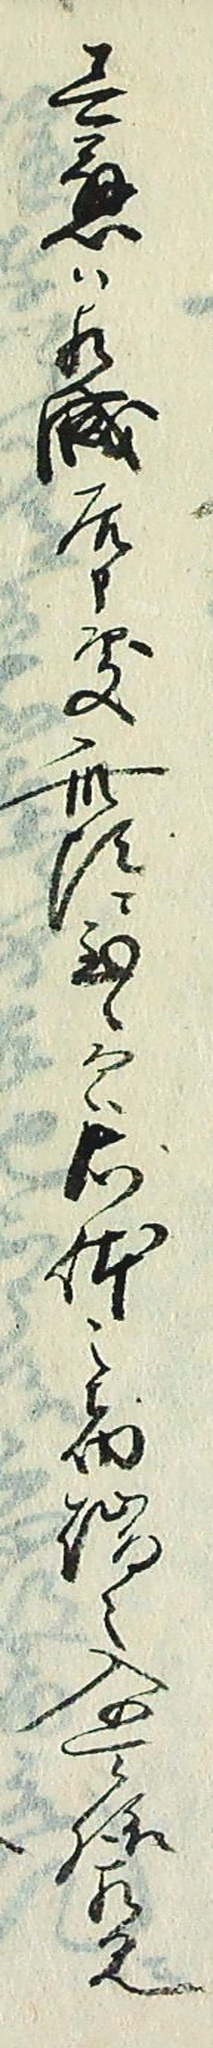壱應ハ相減居申處此頃ニ至候而ハ右体之者端々入込候様相見
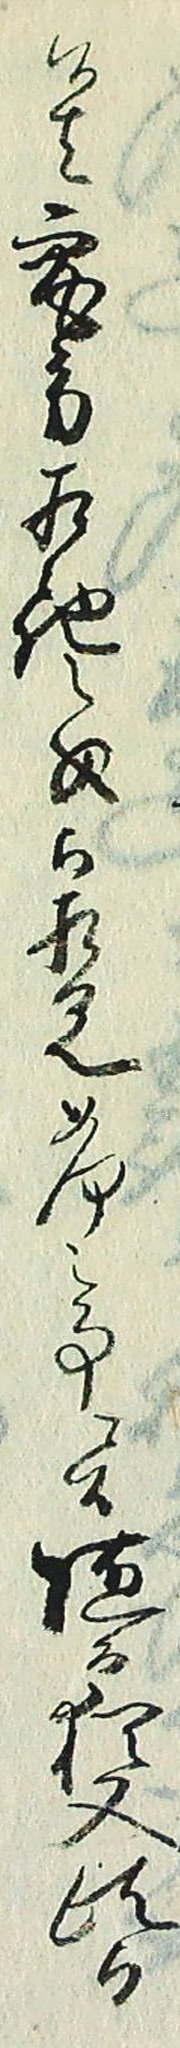候者究方相弛之義与相見如何之事ニ候随而猶又屹与
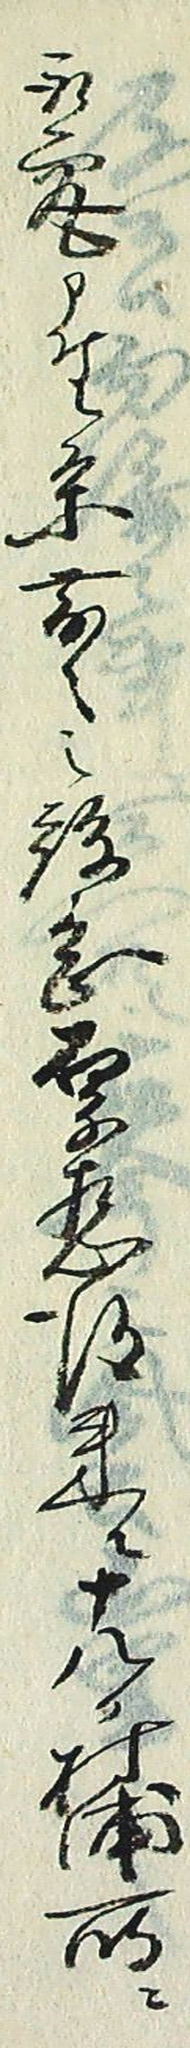取究申付候条前々之趣意厚相心得来ル十八日村浦一時ニ
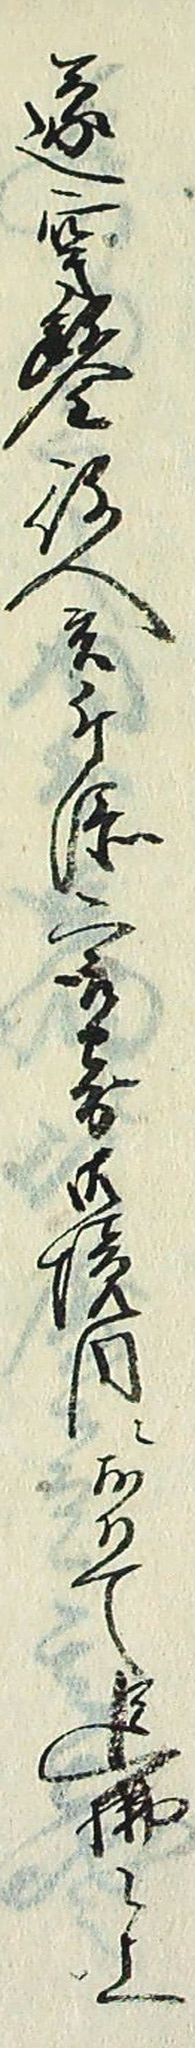遂穿鑿役人共付添最寄御境目ニおゐて追拂之上
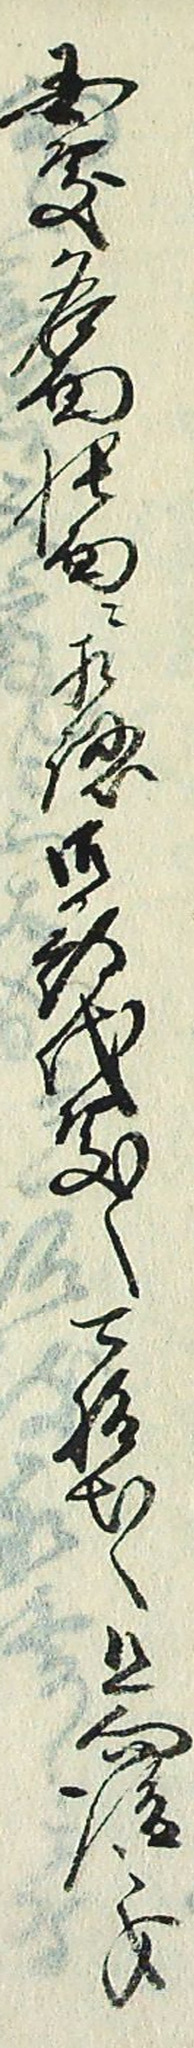国處名面帳面ニ相認御郡代處へ可指候且向後之義
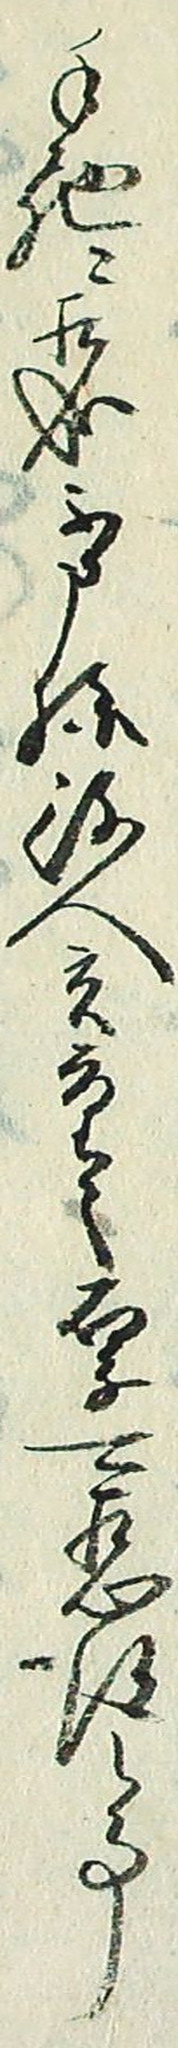手弛ニ相成不申様役人共重々厚可相心得候事

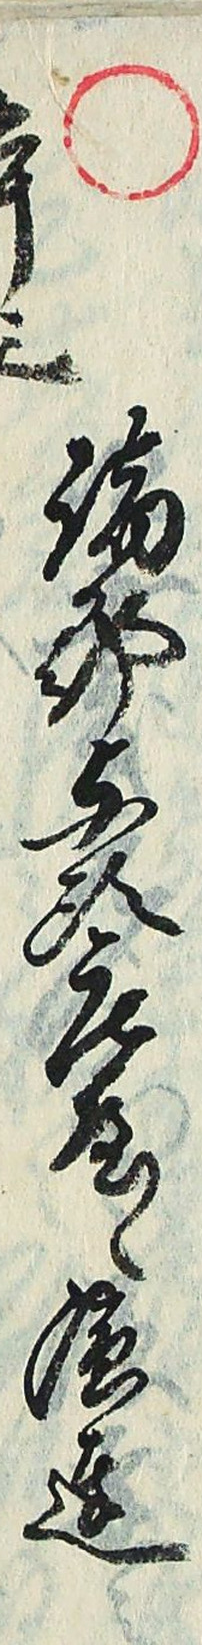○諸郡与頭庄屋へ演達
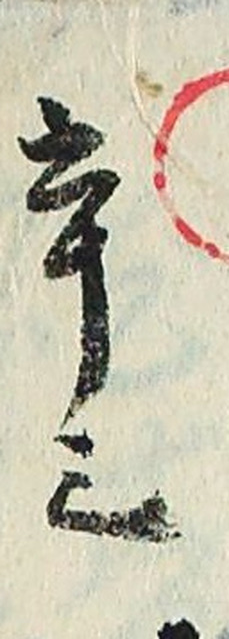六十三
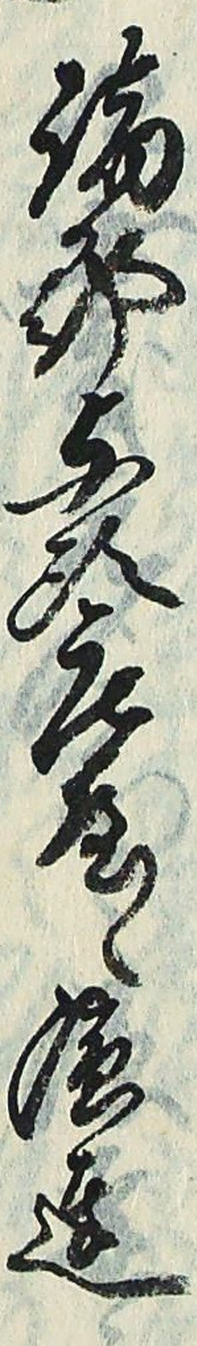○諸郡与頭庄屋へ演達
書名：諸御趣意書并御下知向之写
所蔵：鳴門教育大学 Naruto University of Education
